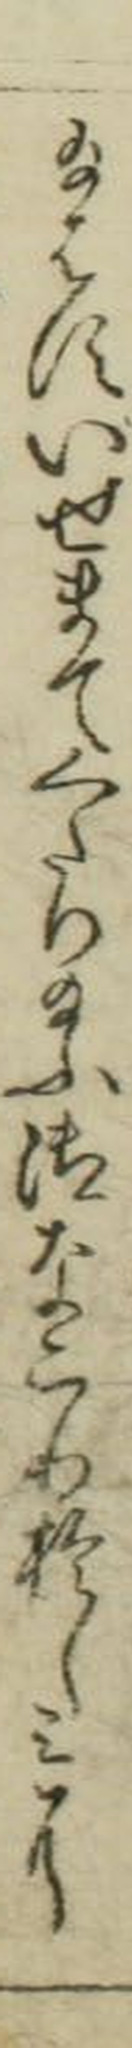給はす。いせまてくたり給ふ御なこりおしみに
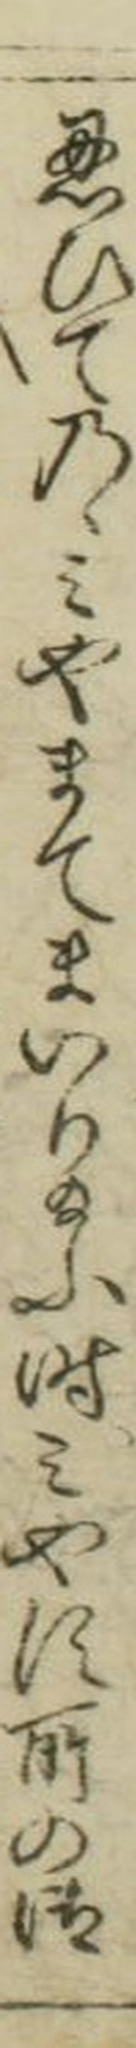忍ひてのゝみやまてまいり給ふ時みやす所の御
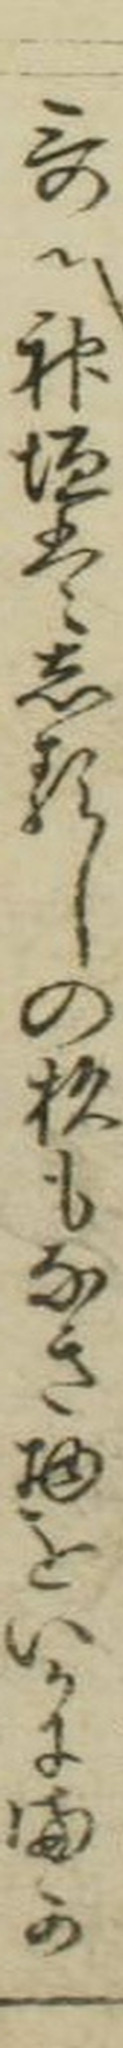哥〽神垣はしるしの杉もなき物をいかにまか
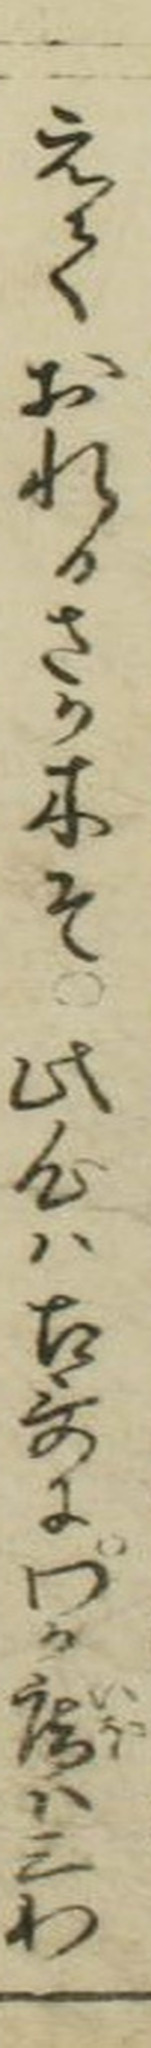えておれるさか木そ○此心は古哥に。わか庵は三わ
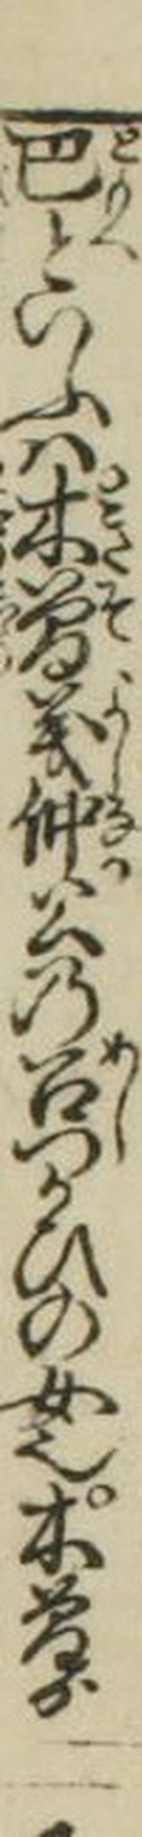巴といふは。木曽義仲公の召つかひの女也。木曽より
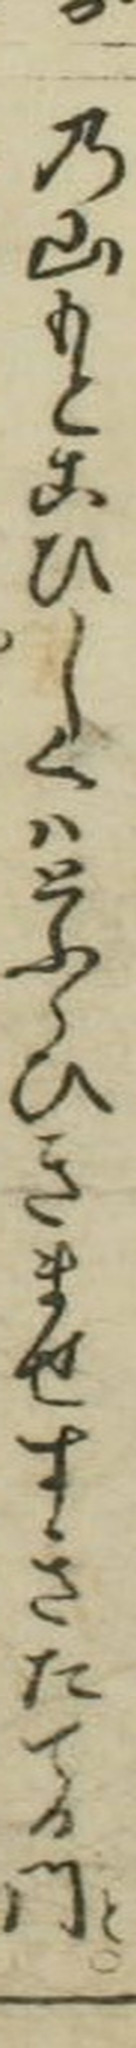の山もとこひしくはとふらひきませすきたてる門。
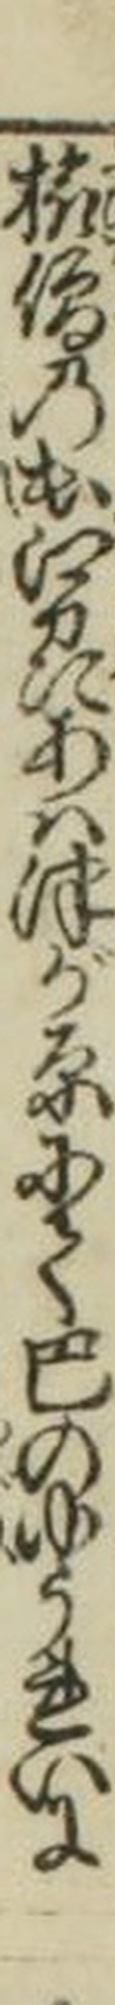旅僧の出。江州あは津が原にて巴のゆうれいに
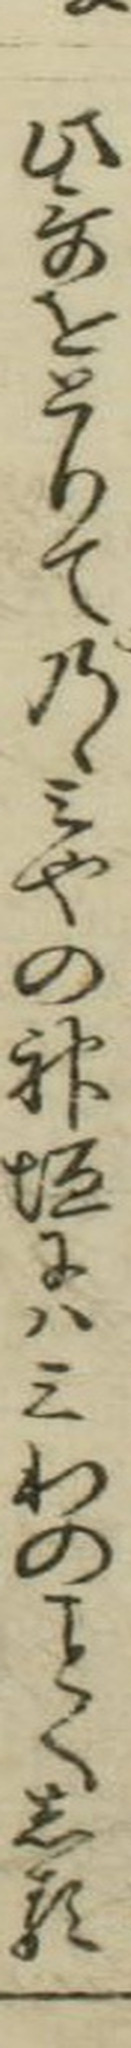此哥をとりて。のゝみやの神垣には三わのことくしる
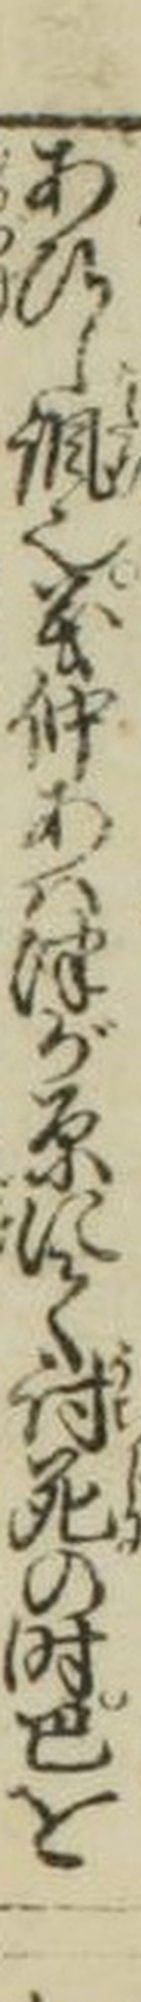あひし諷也。義仲あは津が原にて討死の時。巴を
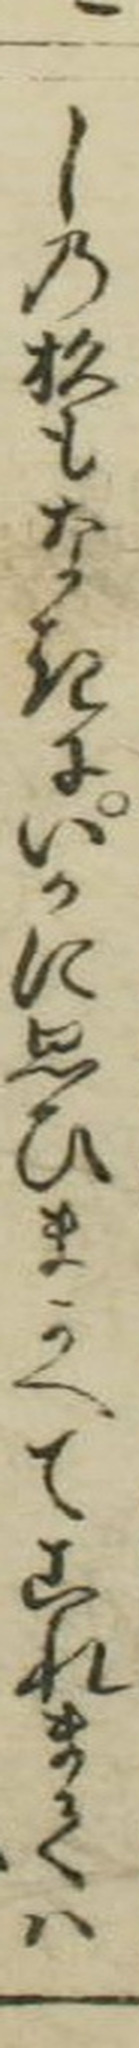しの杉もなきに。いかに思ひまかへてこれまては
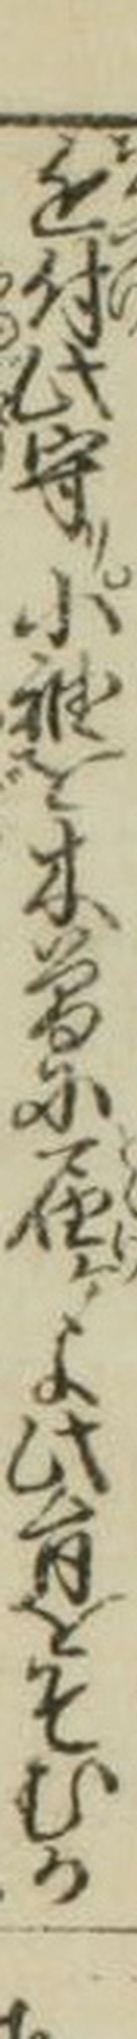近付此守り。小袖を木曽に届けよ此旨をそむか
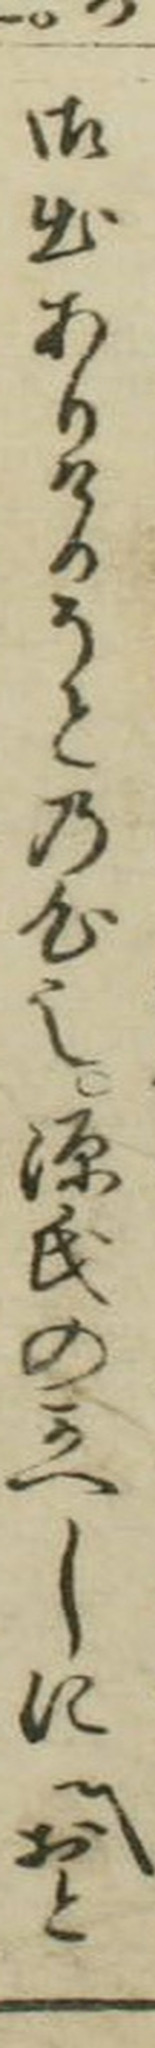御出ありけるそとの心也。源氏のかへしに〽おと
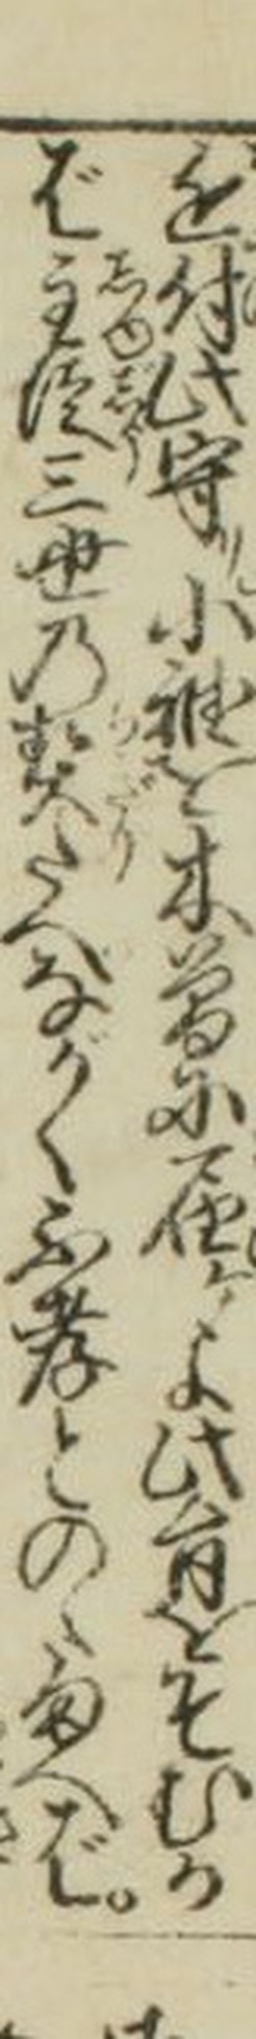ば主従三世の契たへながく不孝とのたまへば。
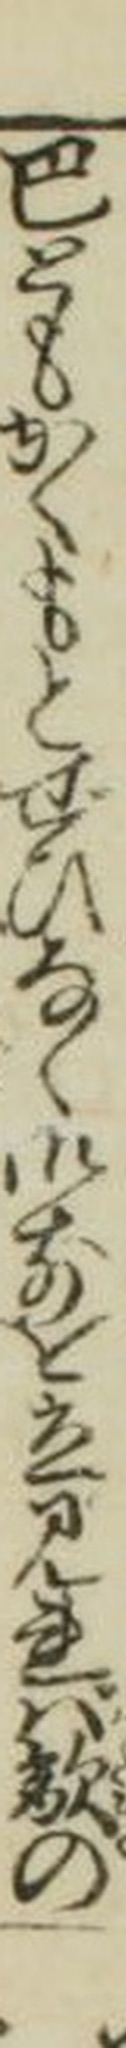巴ともかくもとぜひなく御前を立見れば敵の
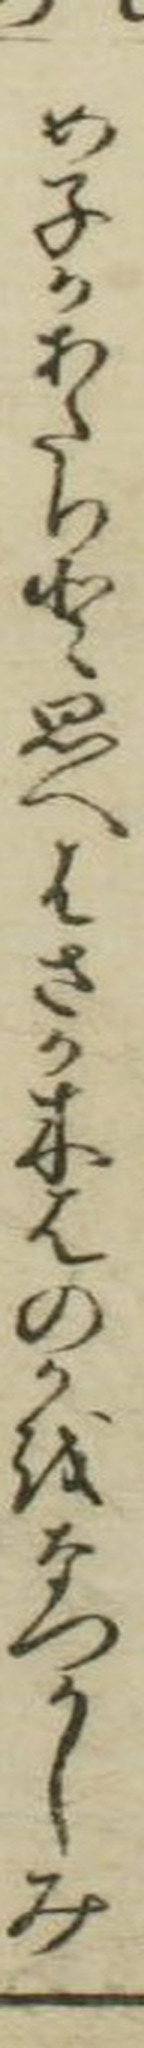め子かあたりと思へはさか木はのかをなつかしみ
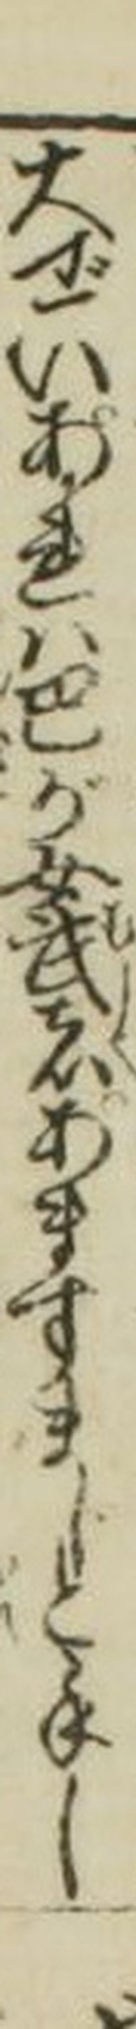大ぜい。あれは巴が女武者。あますまじと手し
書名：女源氏教訓鑑
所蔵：東京学芸大学附属図書館
